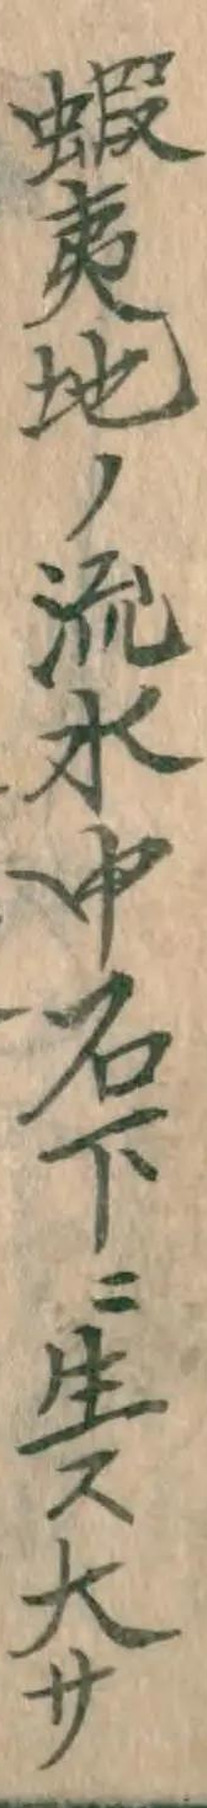蝦夷地ノ流水中石下ニ生ス大サ
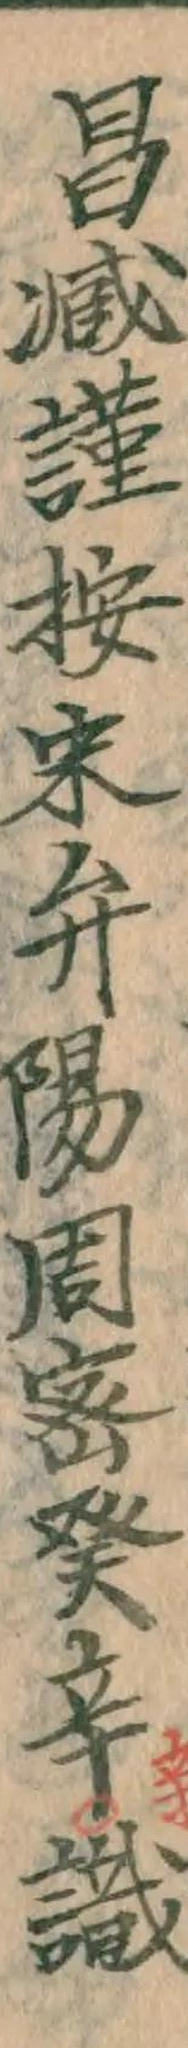昌蔵謹按宋弁陽周密癸辛◦雜識
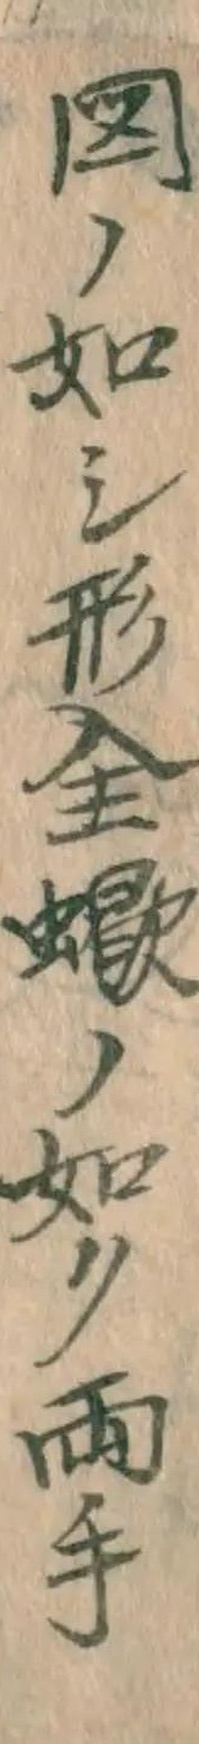図ノ如シ形全蠍ノ如ク両手
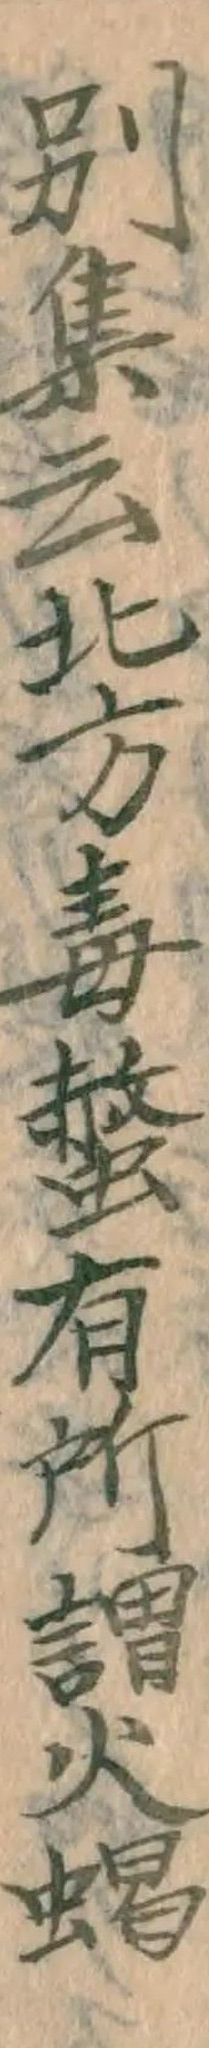別集云北方毒螫有所謂火蝎
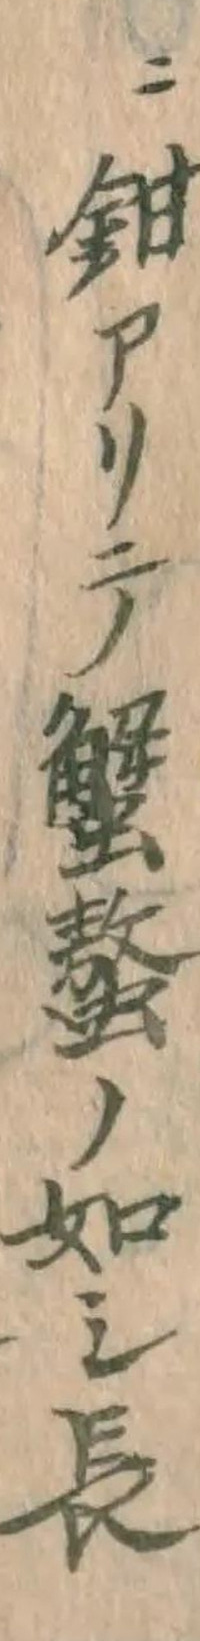ニ鉗アリテ蟹螯ノ如シ長
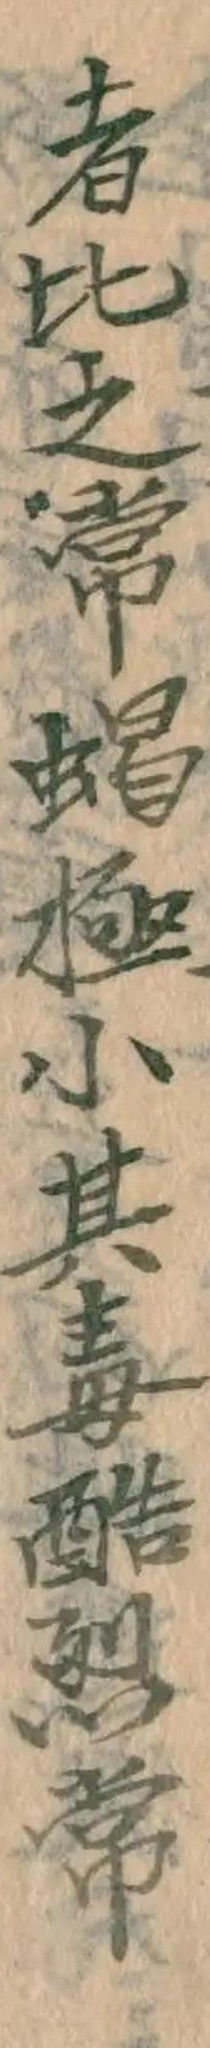者比之常蝎極小其毒酷烈常
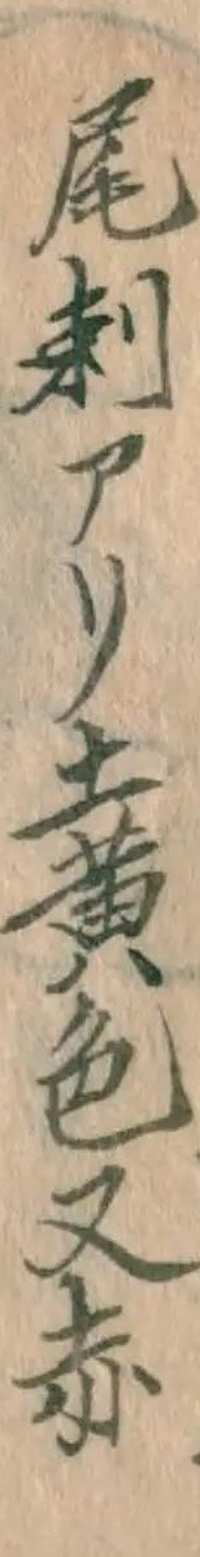尾刺アリ土黄色又赤
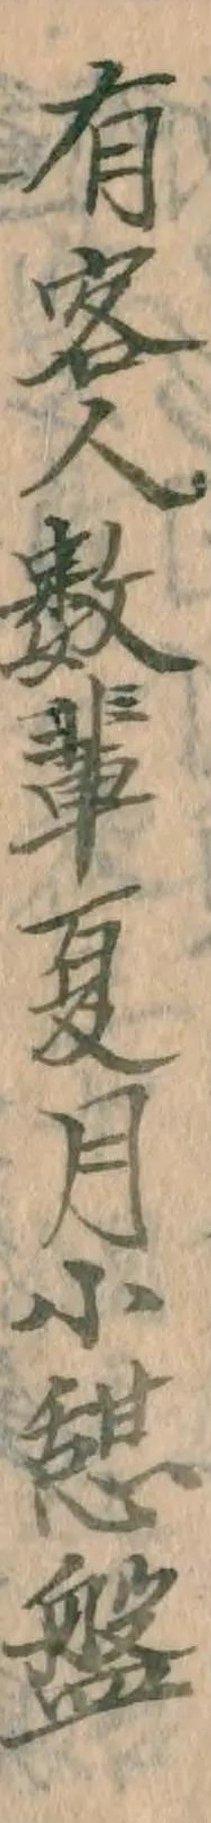有客人数輩夏月小憇盤
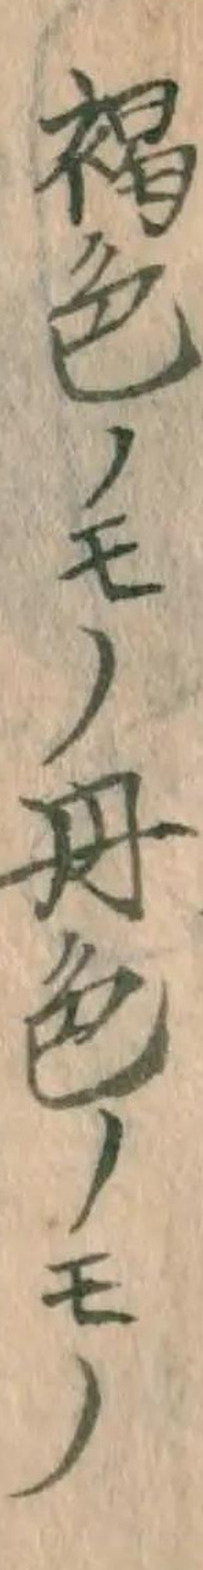褐色ノモノ丹色ノモノ
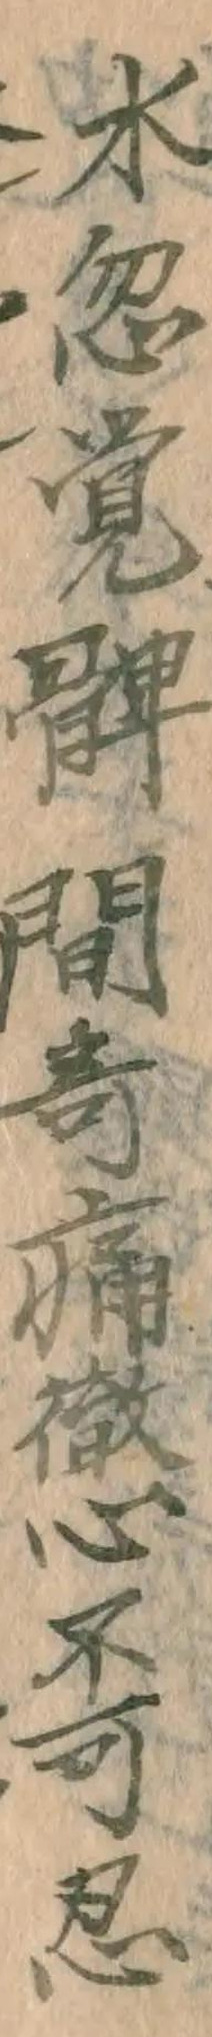水忽覚髀間奇痛徹心不可忍
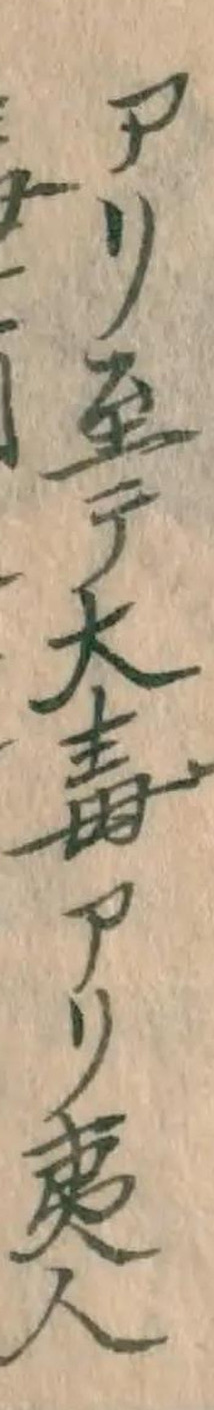アリ至テ大毒アリ夷人
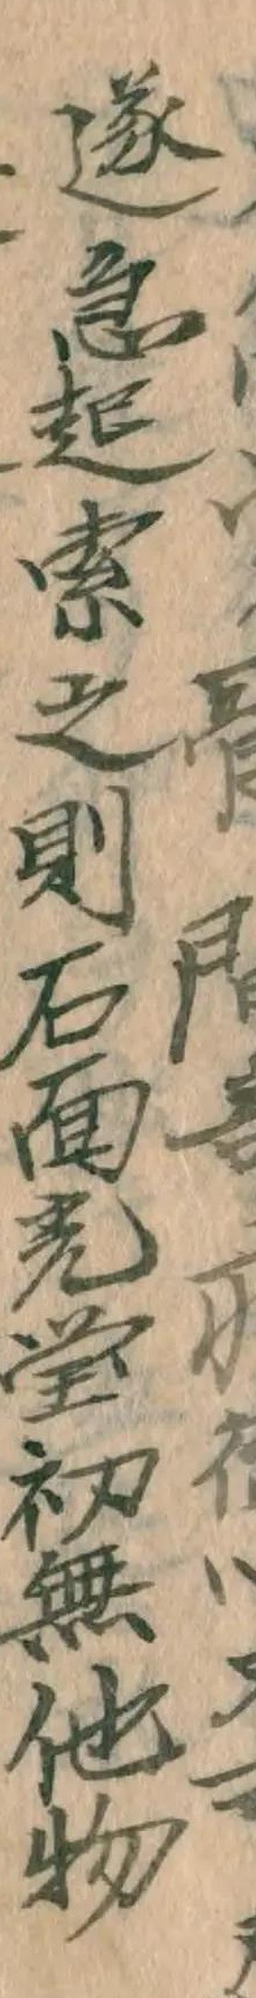遂急起索之則石面光初無他物
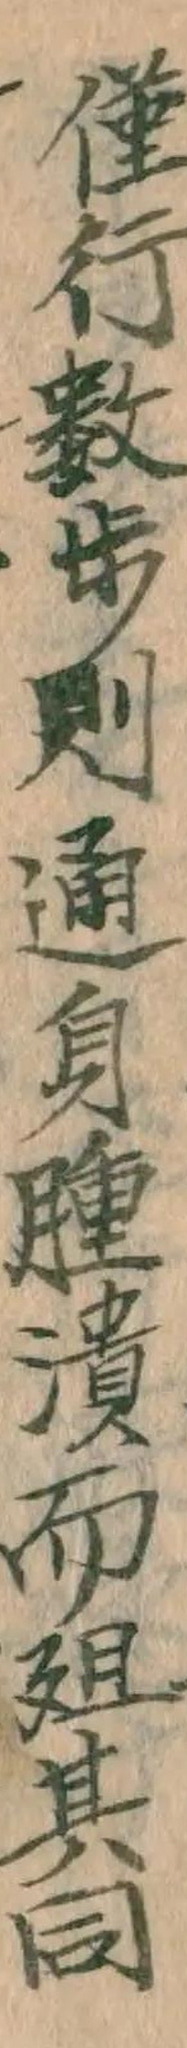僅行数歩則通身腫潰而殂其同
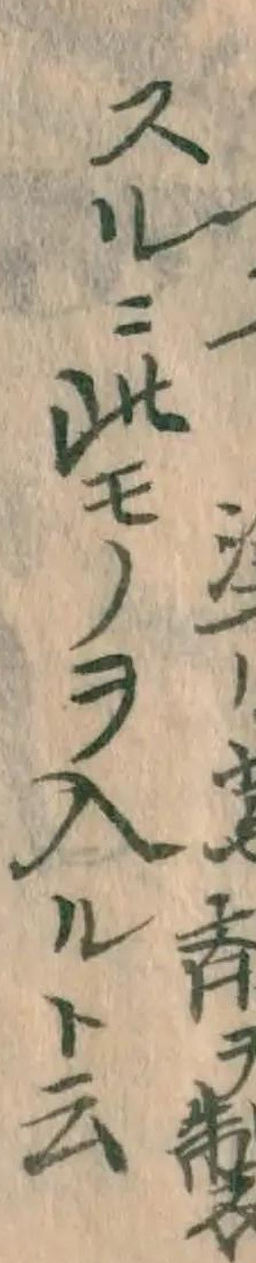スルニ此モノヲ入ルト云
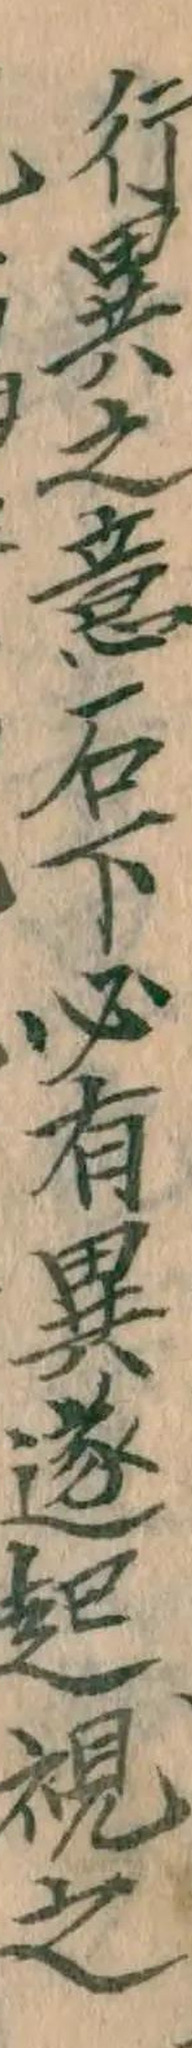行異之意石下必有異遂起視之
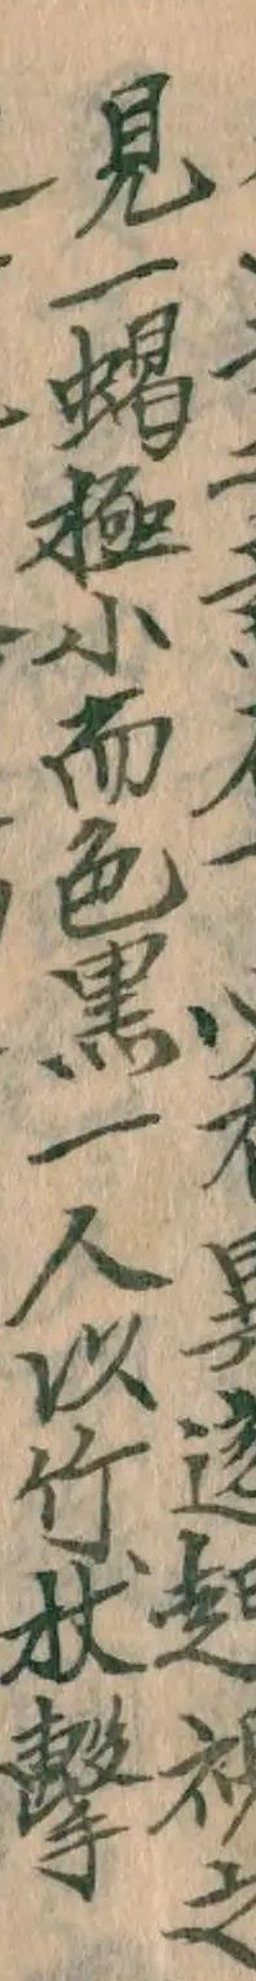見一蝎極小而色黒一人以竹杖撃
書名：千蟲譜 3巻. [3]
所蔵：国立国会図書館 National Diet Library, JAPAN
